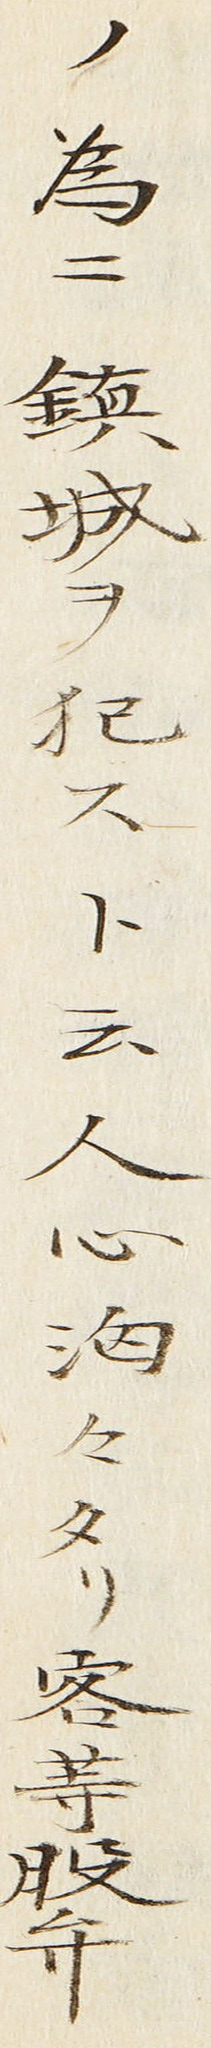ノ為ニ鎮城ヲ犯スト云人心洶々タリ客等股弁
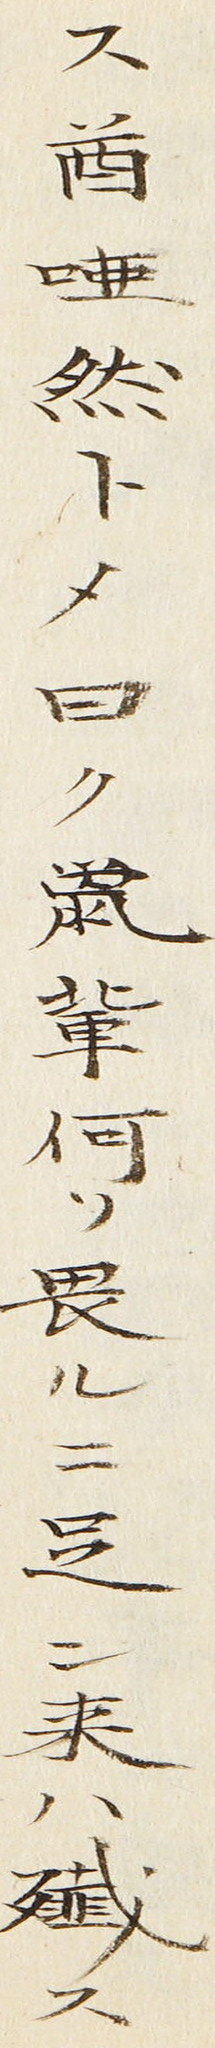ス酋唖然トシテ曰ク巤輩何ソ畏ルニ足ン来ハ殲ス
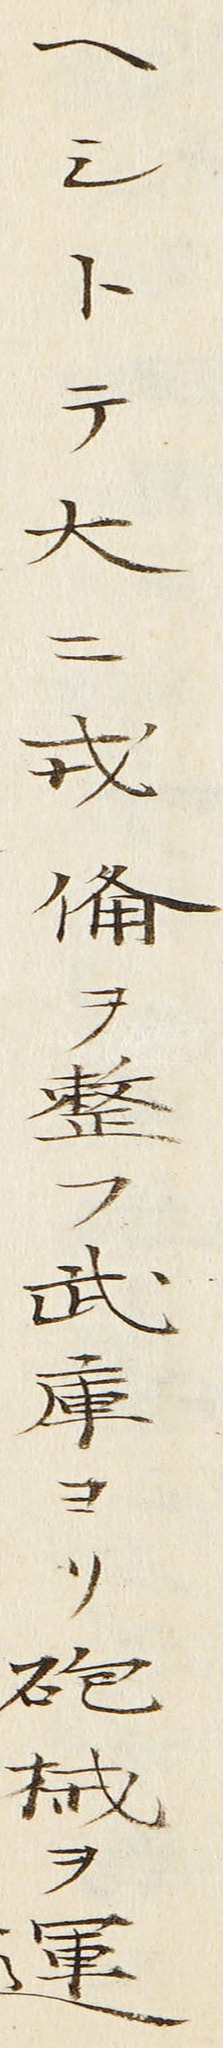ヘシトテ大ニ戎備ヲ整フ武庫ヨリ砲械ヲ運
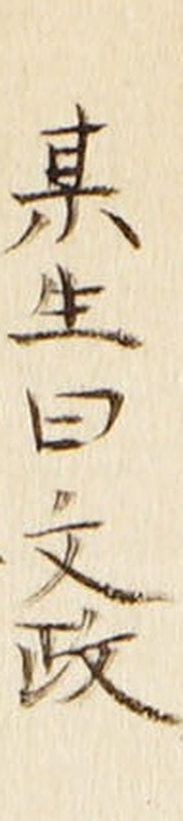某生曰文政
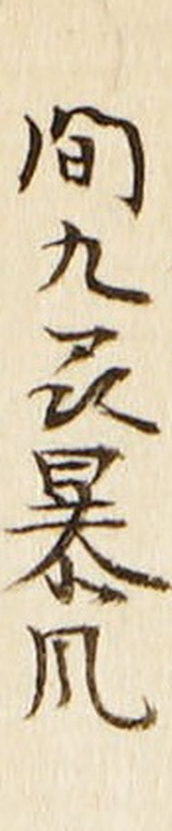間九州暴風
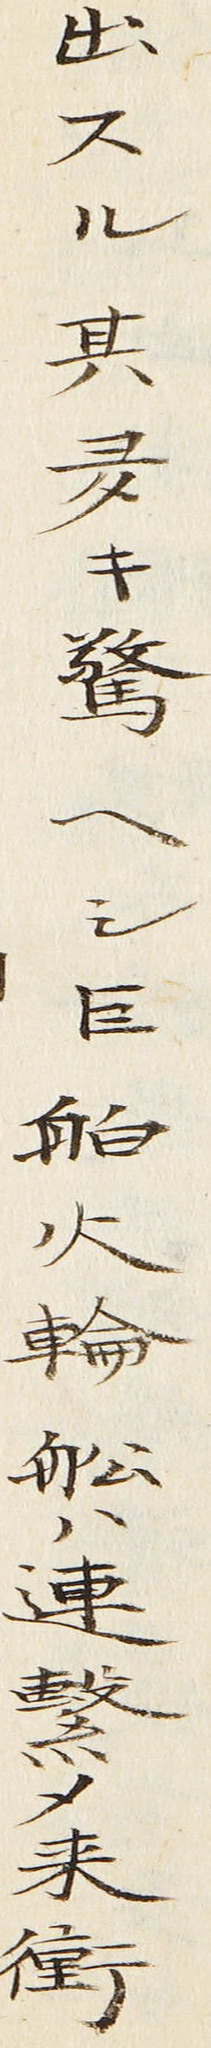出スル其多キ驚ヘシ巨舶火輪船ハ連繋シテ来衝
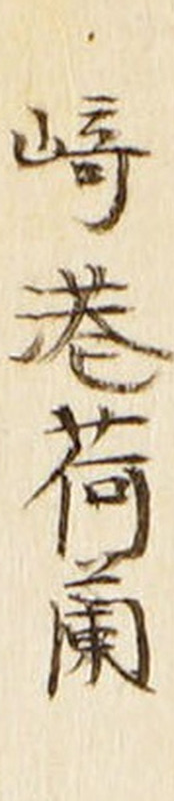崎港荷蘭
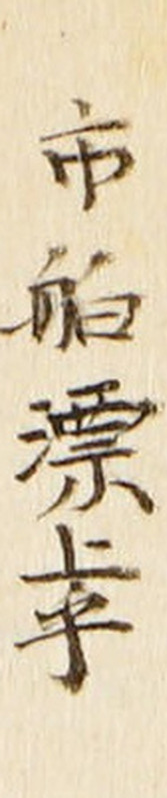市舶漂上乎
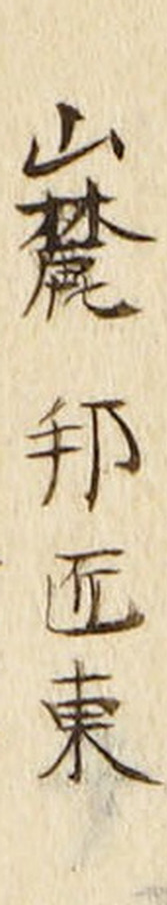山麓邦匠東
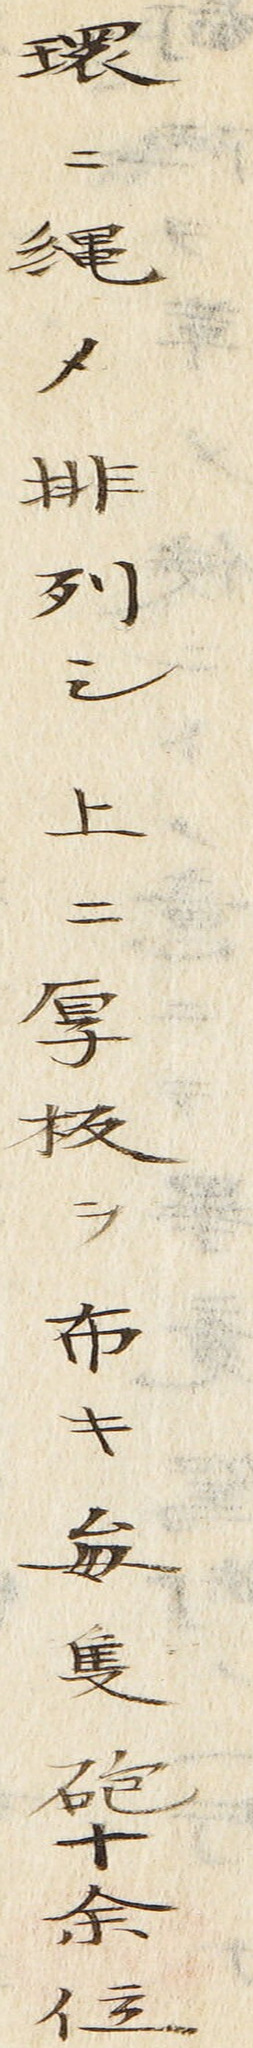環ニ縄シテ排列シ上ニ厚板ヲ布キ毎隻砲十余位
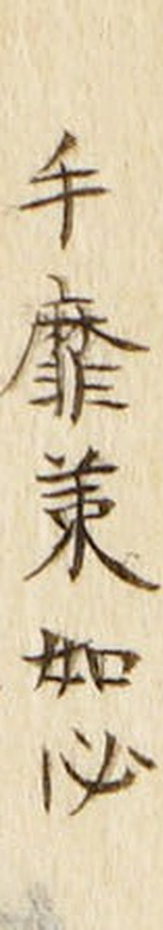手靡策如必
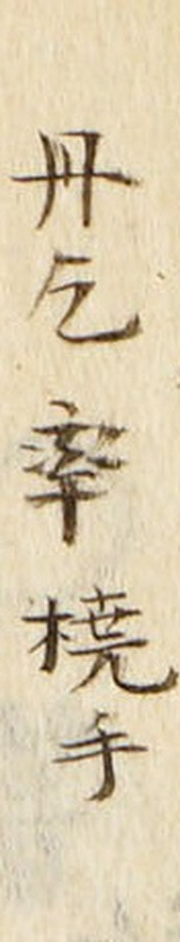丹乞率橈手
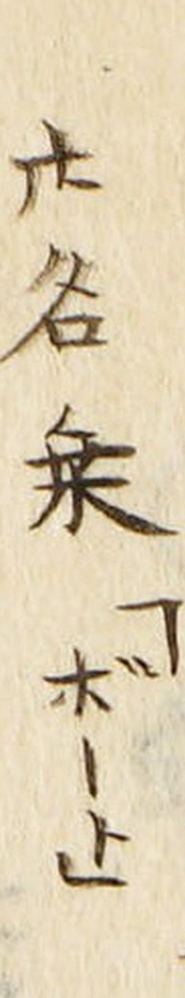廿名乗「ボート」
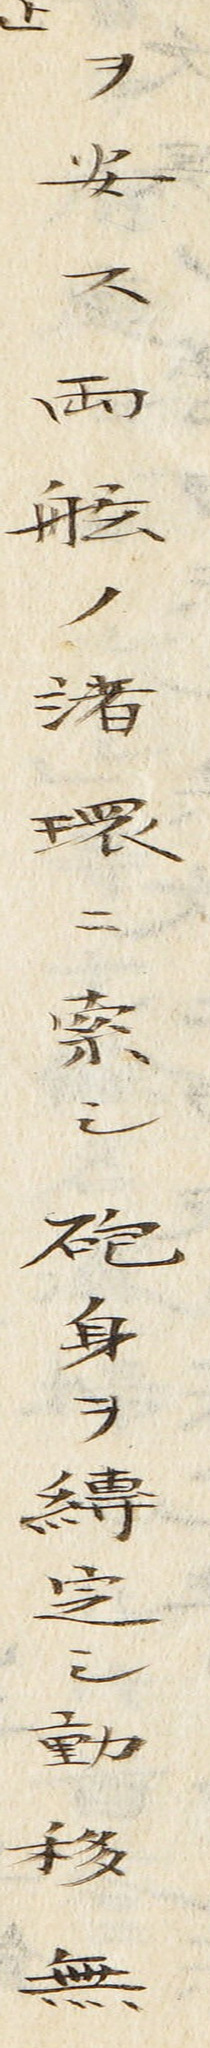ヲ安ス両舷ノ諸環ニ索シ砲身ヲ縛定シ動移無
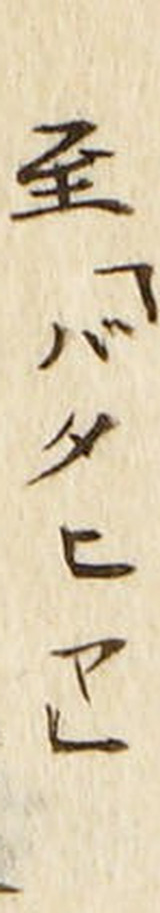至「バタヒヤ」
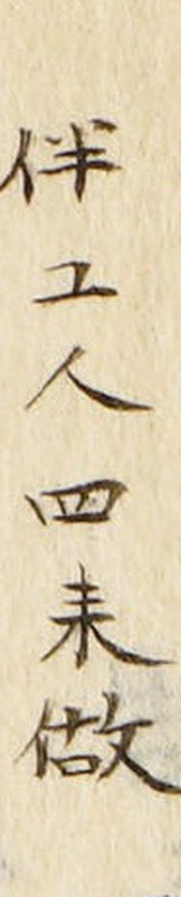伴ユ人四来做
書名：流蕃通書
